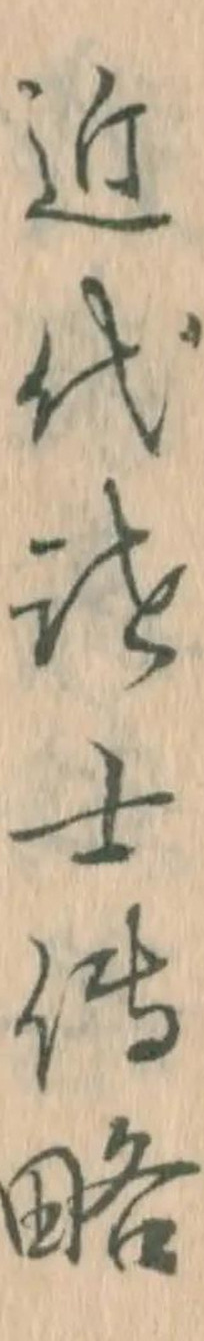近代諸士伝略

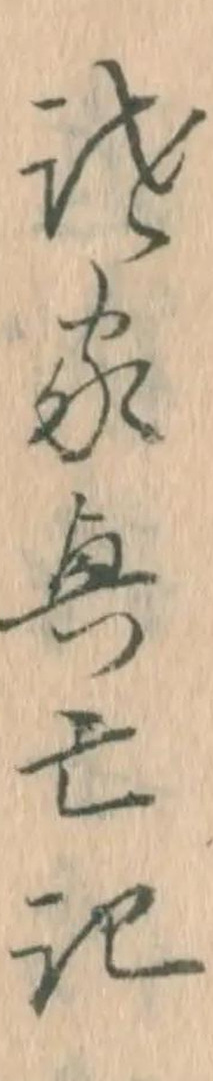諸家興亡記
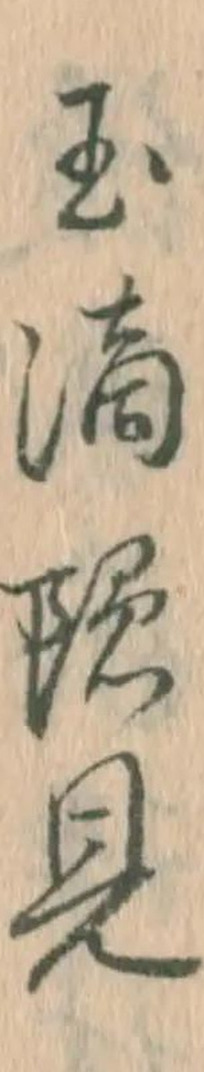玉滴隠見
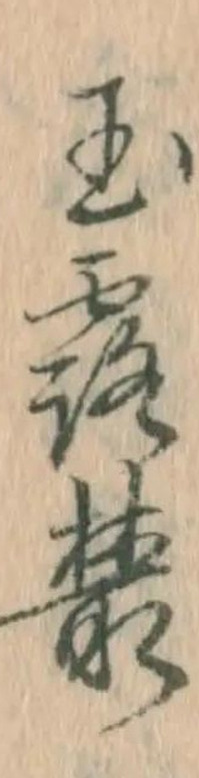玉露叢
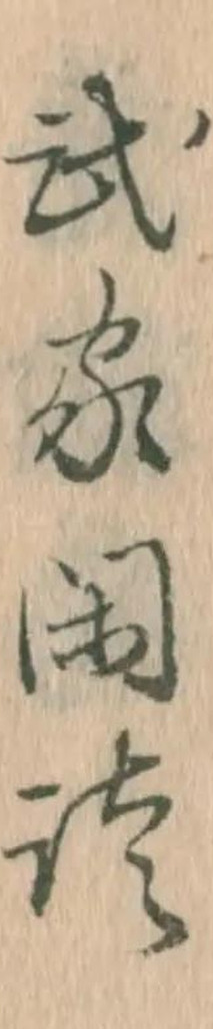武家閑談
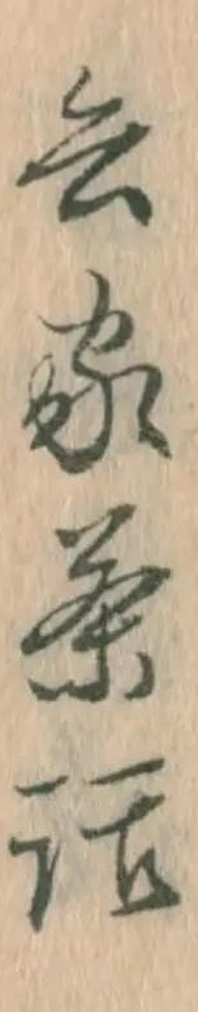兵家茶話
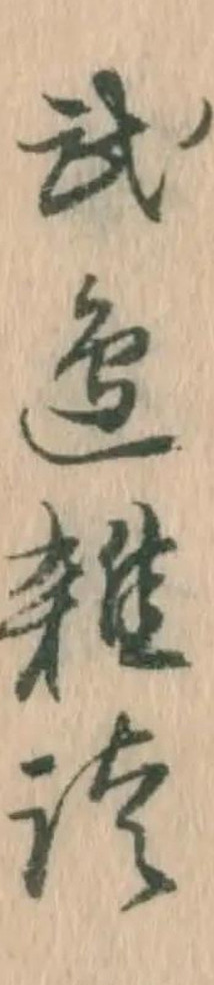武辺雑談
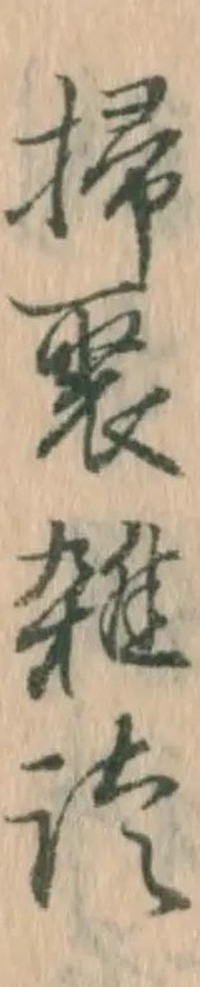掃聚雑談
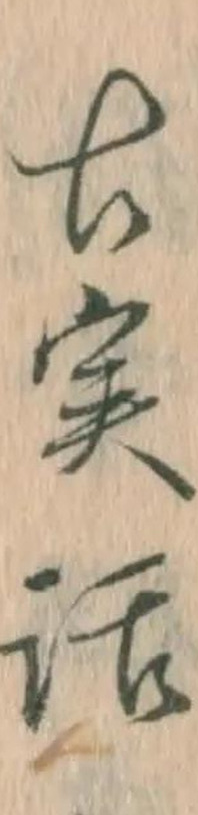古実話
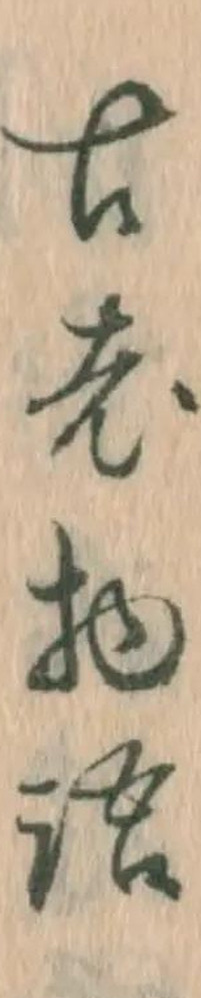古老物語
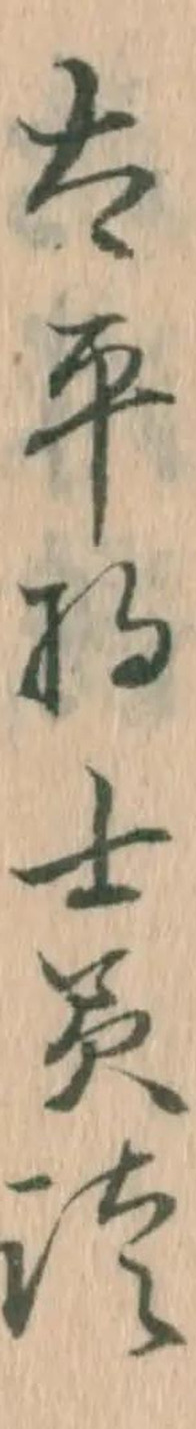太平将士美談
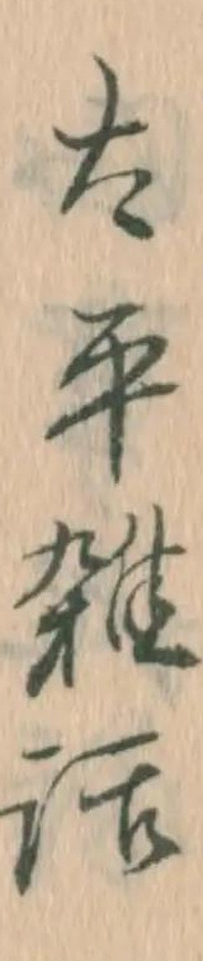太平雑話
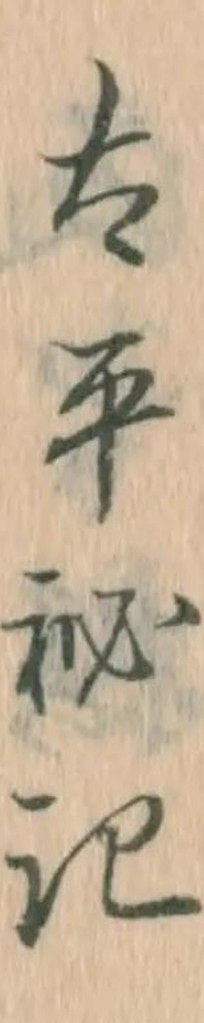太平秘記
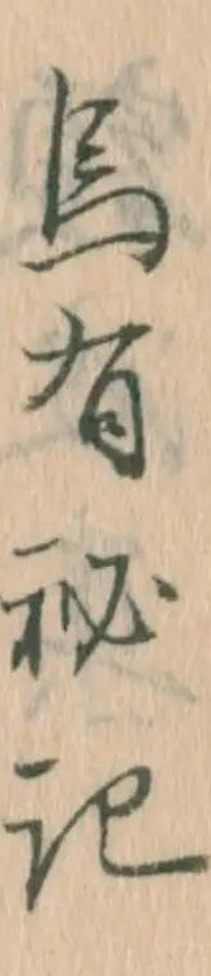烏有秘記
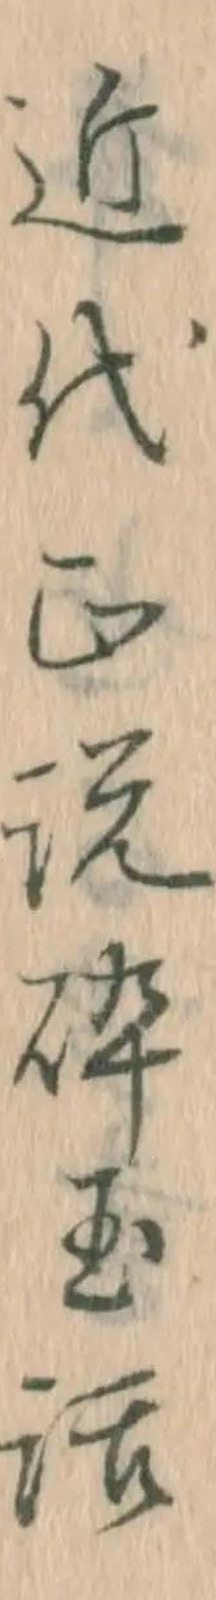近代正説砕玉話
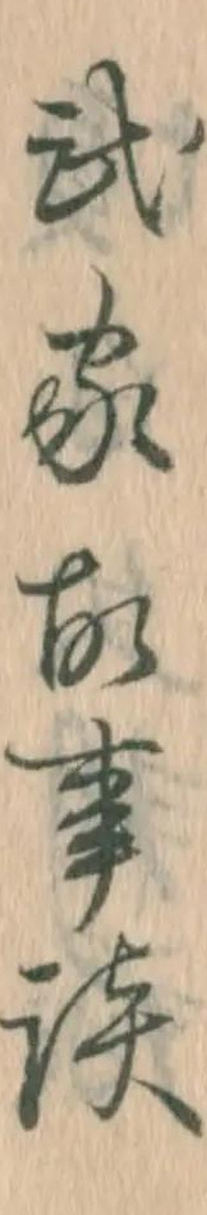武家故事談
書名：切支丹御退治記 49巻. [1]
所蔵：国立国会図書館 National Diet Library, JAPAN
